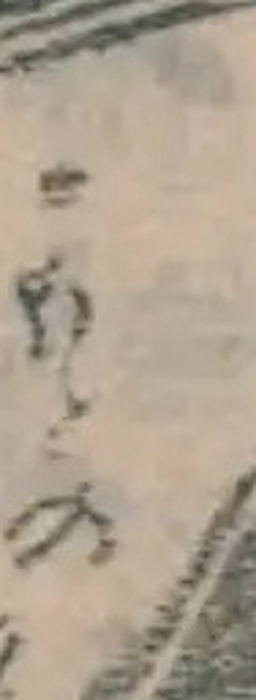もとの
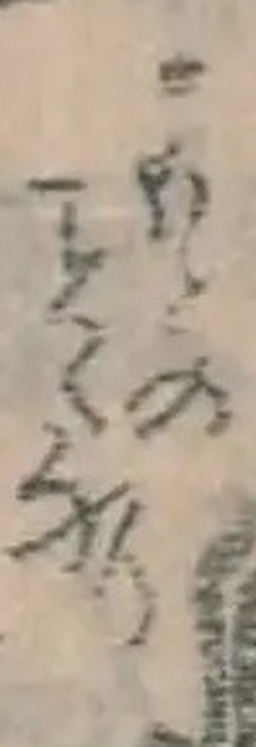ことくなり
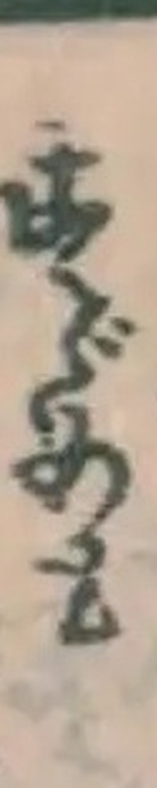すゞめも
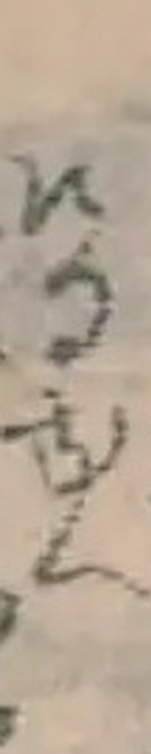けるゆへ
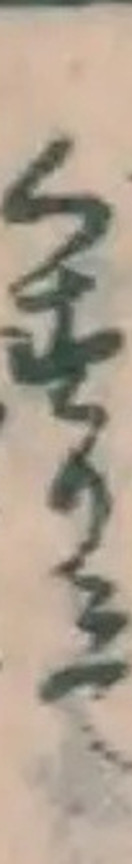くすりにて
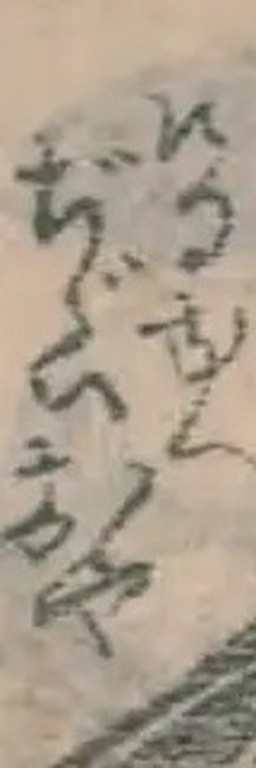ぢゝいおや
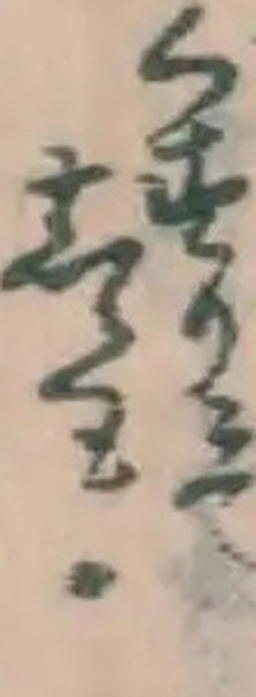いたり
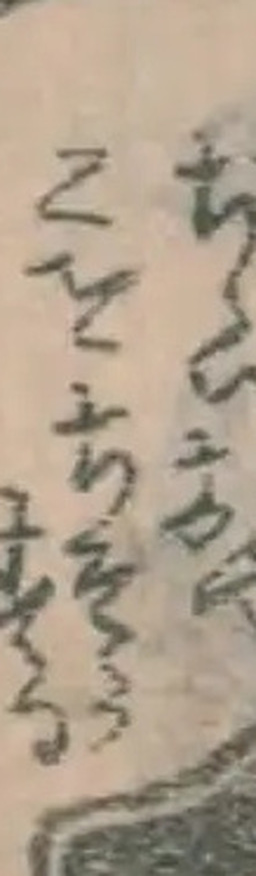こをちそう

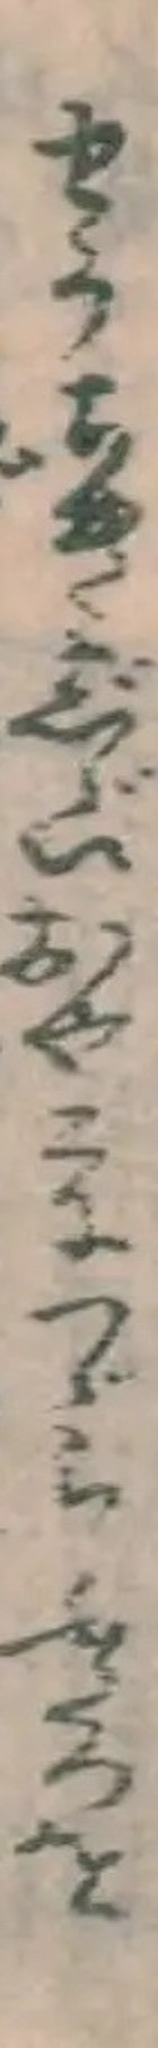せうちきじゞいおやこにつゞらふたつを
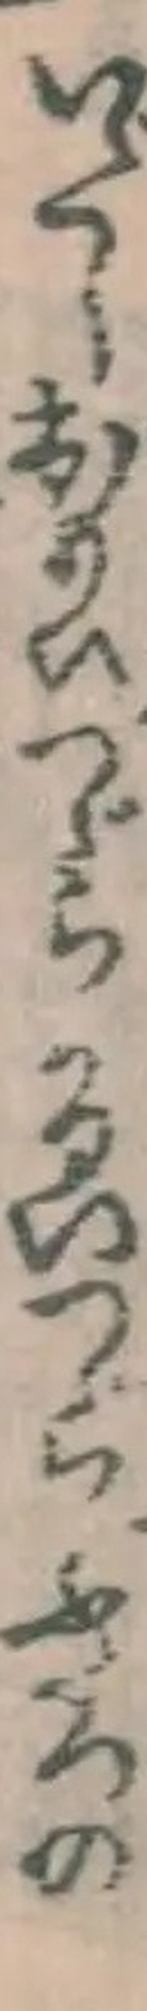いだしおもひつゞらかるいつゞらふたつの
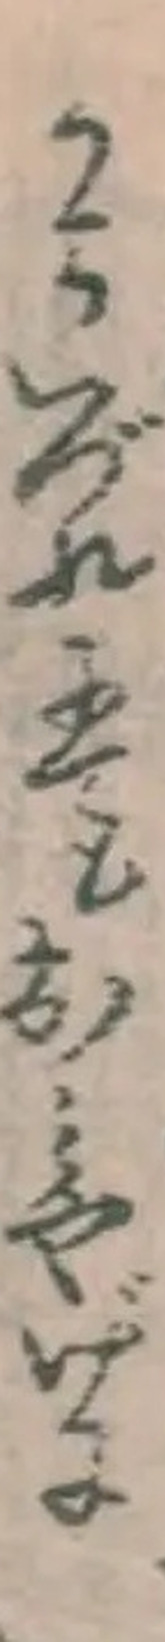うちいづれにてもおみやげに
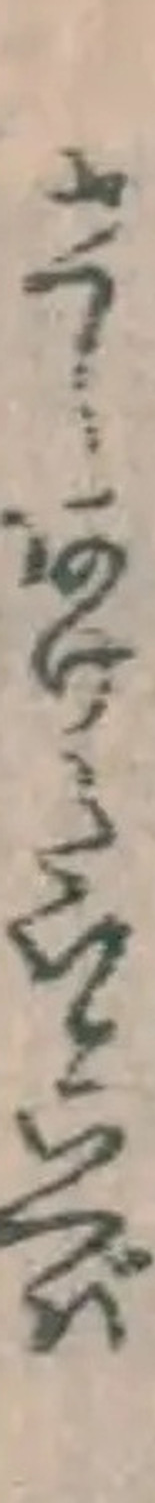さしあけたいといへば
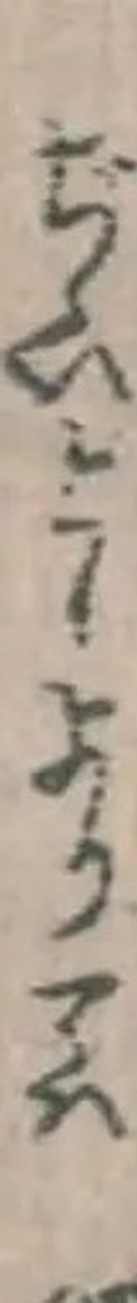ぢいとしよりては
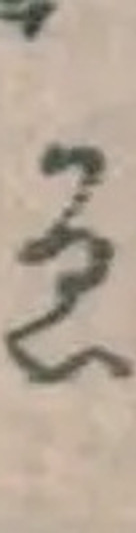かるい
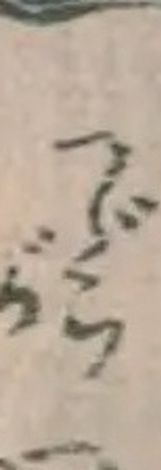つゞら
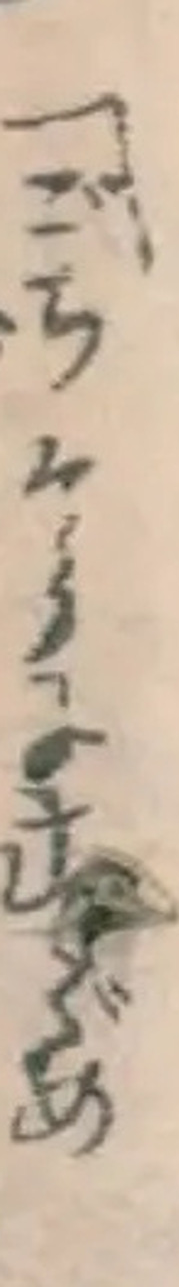〽ごちそうにすゞめ
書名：舌切雀
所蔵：国立国会図書館 National Diet Library, JAPAN
